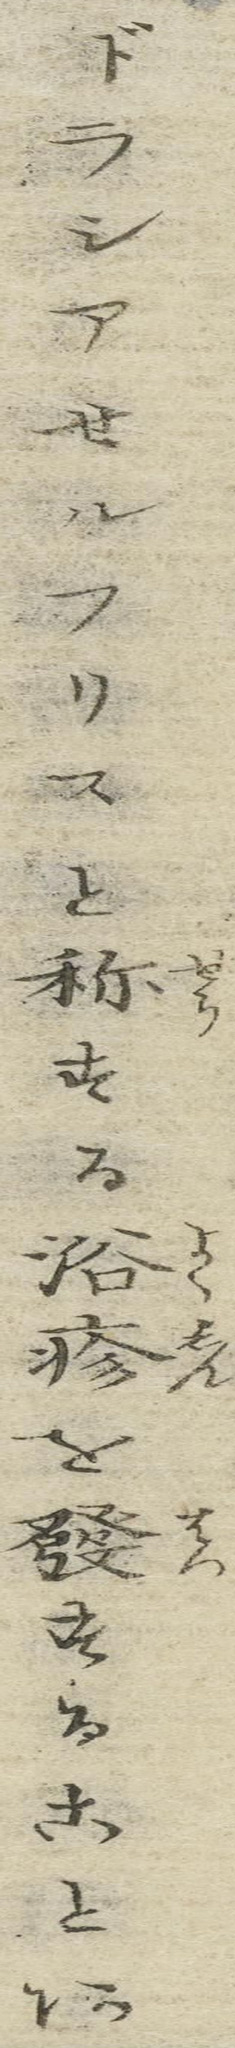ドラシアセルフリスと称する浴疹を発することあ
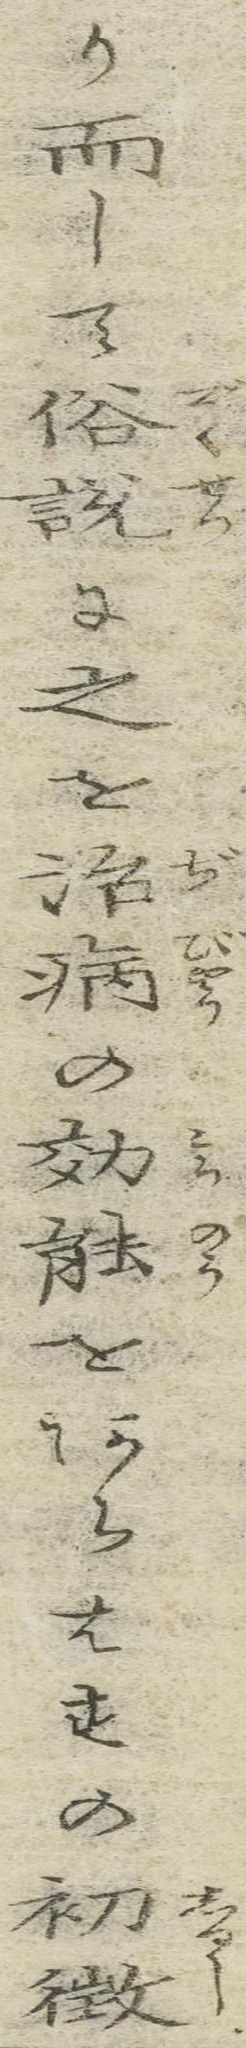り而して俗説に之を治病の効能をあらはすの初徴
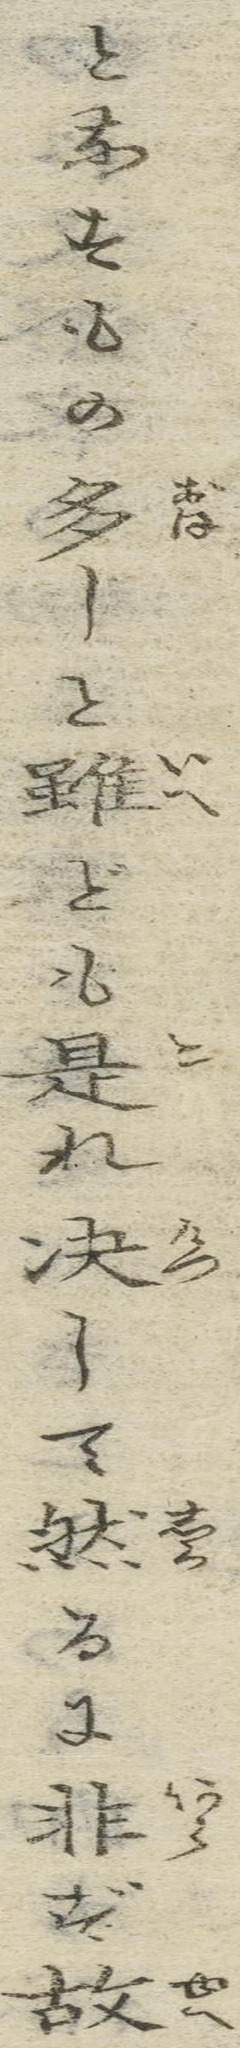となすもの多しと雖ども是れ決して然るに非ず故
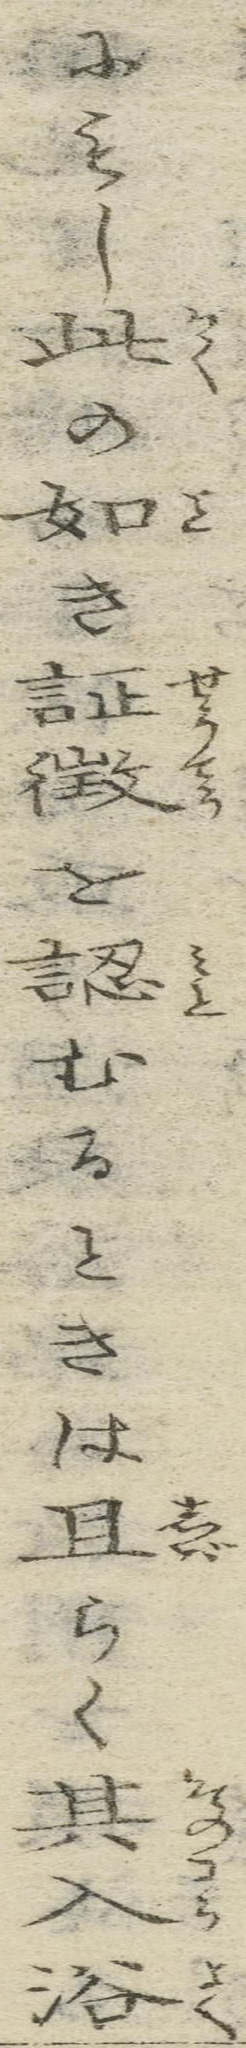にもし此の如き証徴を認むるときは且らく其入浴
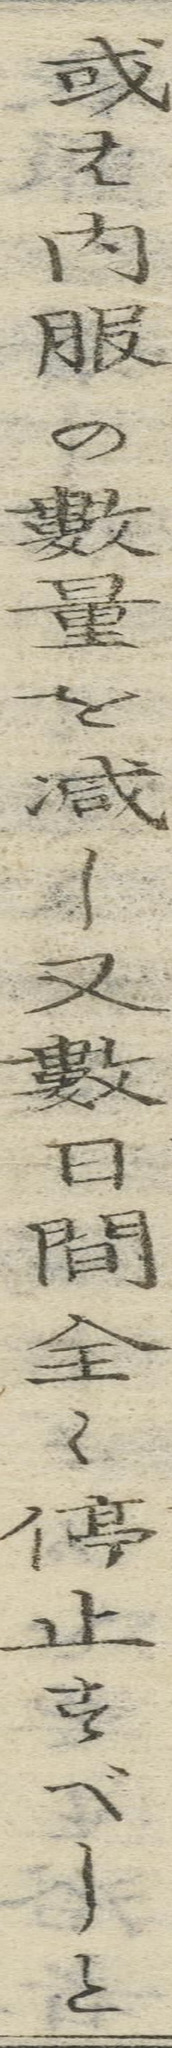或は内服の数量を減じ又数日間全く停止すべしと
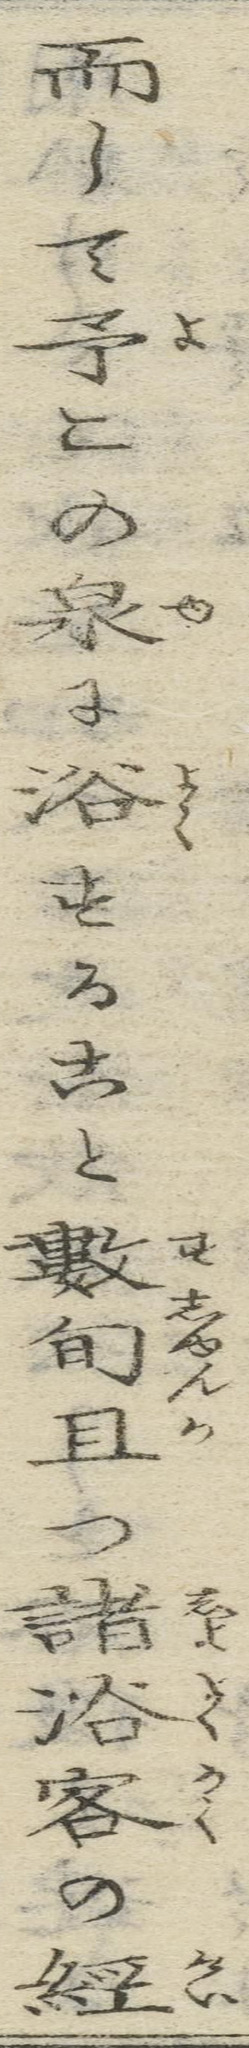而して予との泉に浴すること数旬且つ諸浴客の経
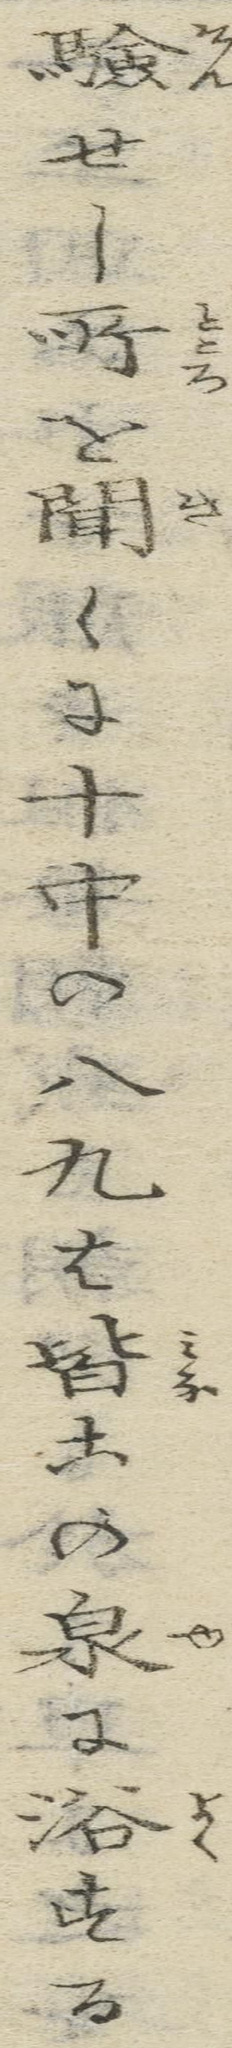験せし所を聞くに十中の八九は皆この泉に浴する
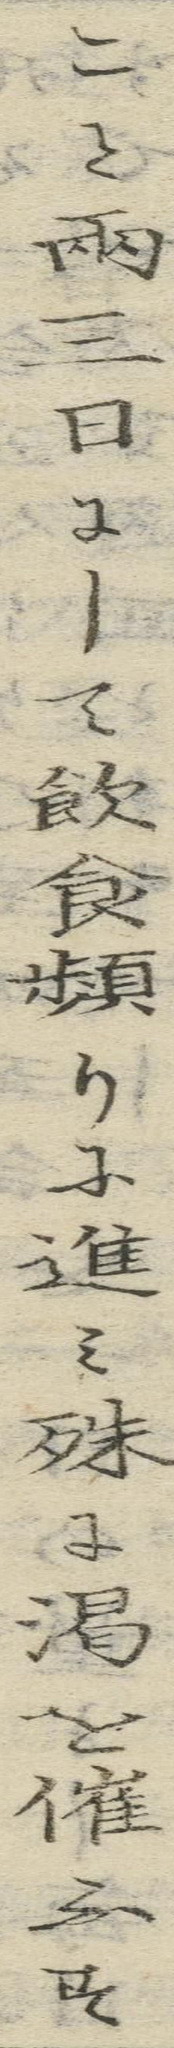こと両三日にして飲食頻りに進み殊に渇を催ふす
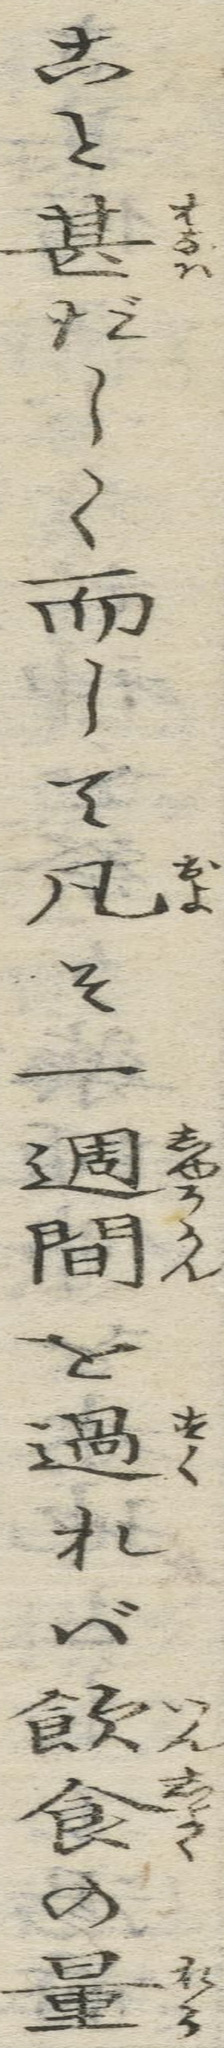こと甚だしく而して凡そ一週間を過れば飲食の量
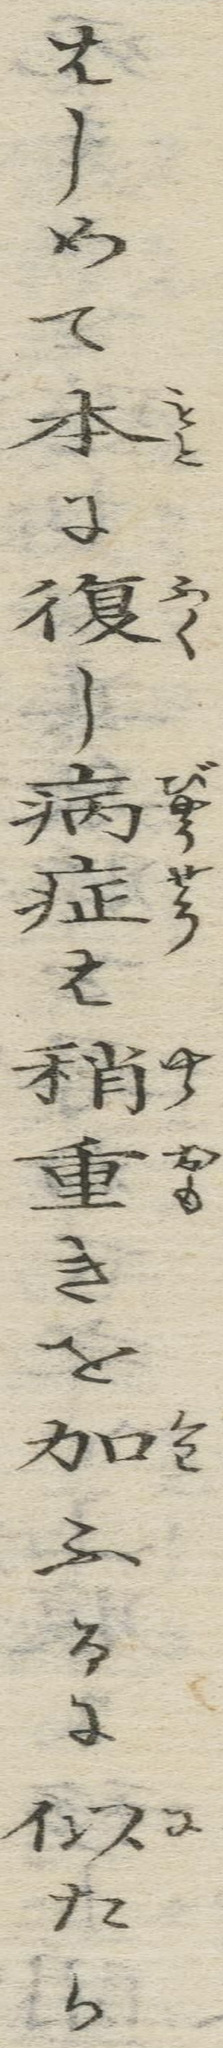はしめて本に復し病症は稍重きを加ふるに似たる
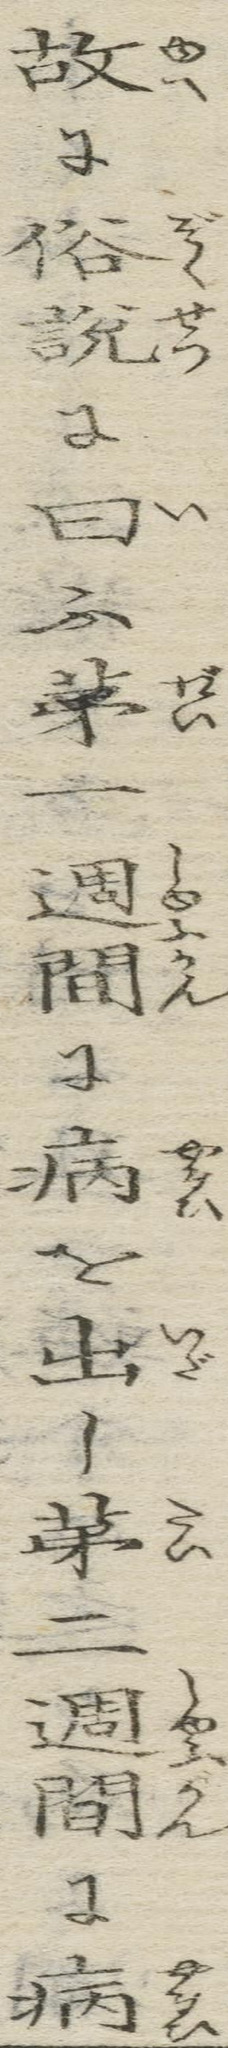故に俗説に曰ふ第一週間に病を出し第二週間に病
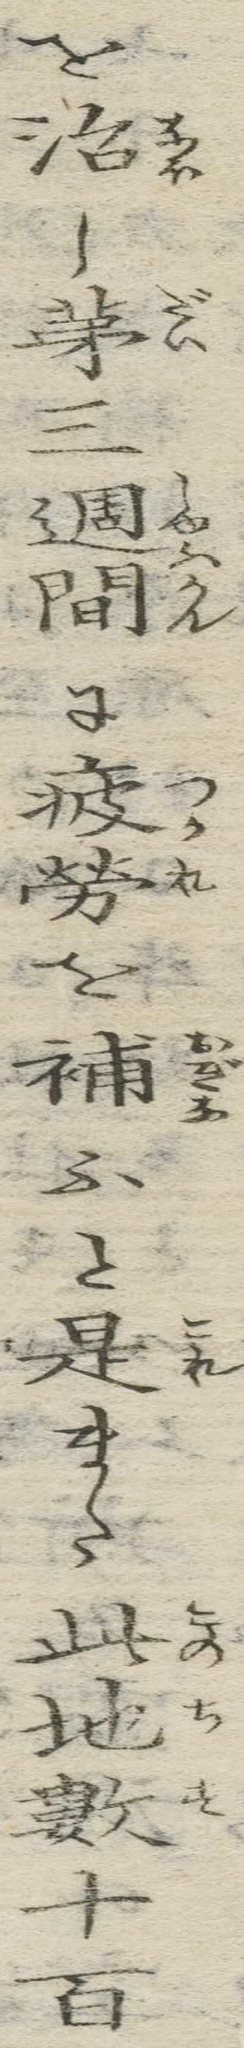を治し第三週間に疲労を補ふと是また此地数十百
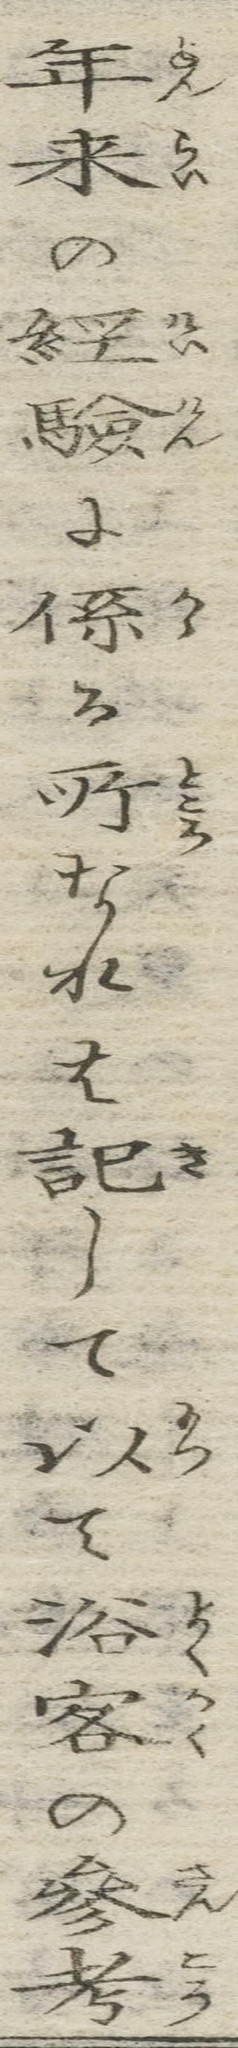年来の経験に係る所なれは記して以て浴客の参考
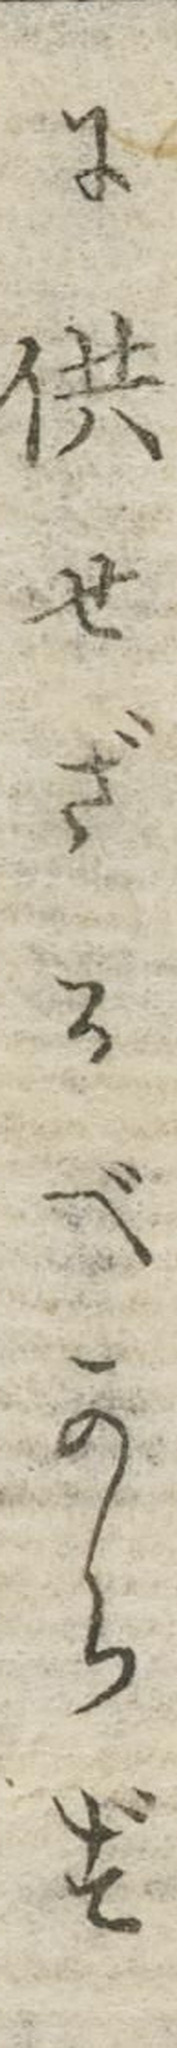に供せざるべからず
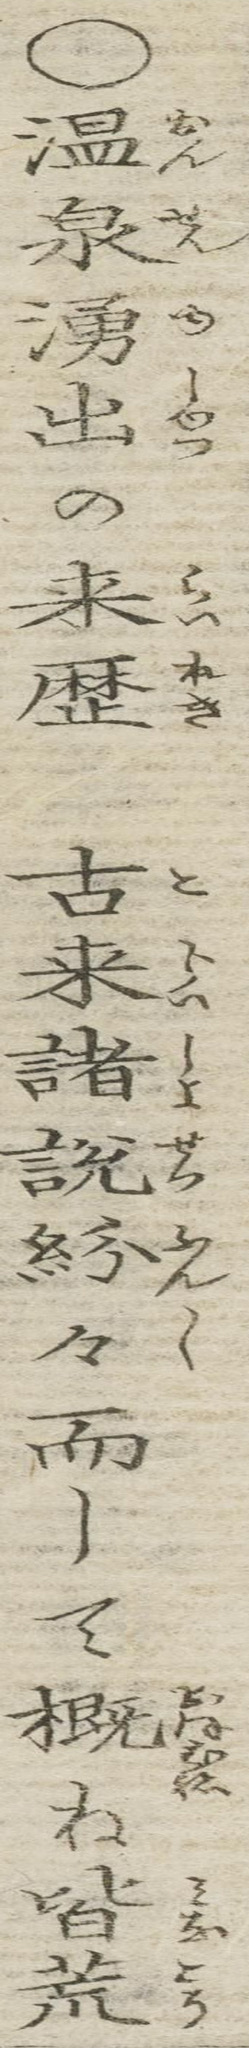○温泉湧出の来歴古来諸説紛々して概ね皆荒
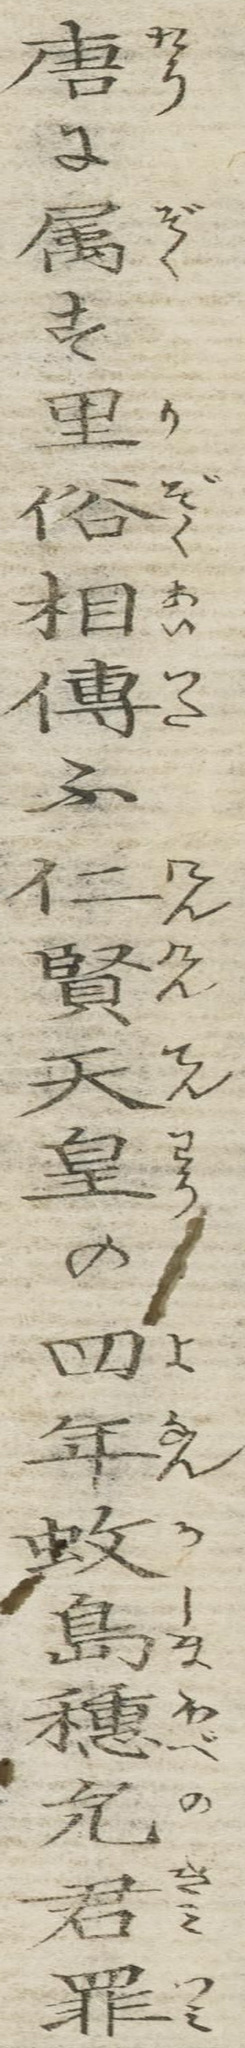唐に属す里俗相伝ふ仁賢天皇の四年蚊島穂瓮君罪
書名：豆州熱海誌　完
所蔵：東京大学地震研究所図書室 Earthquake Research Institute Library, The University of Tokyo, JAPAN
